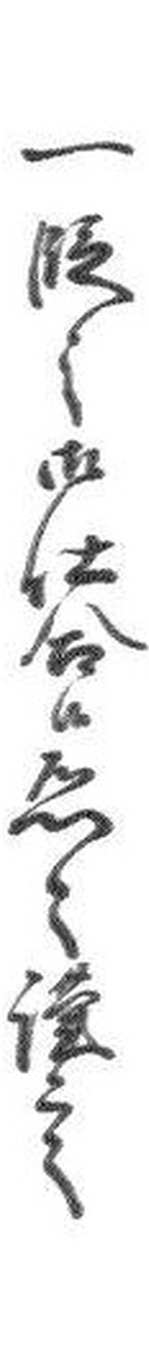一段之御仕合候恐々謹言

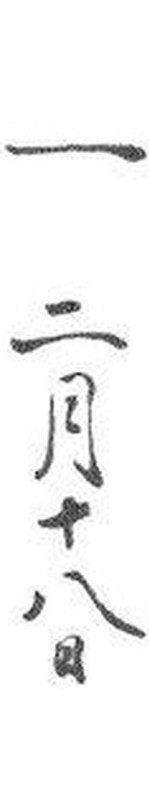一二月十八日
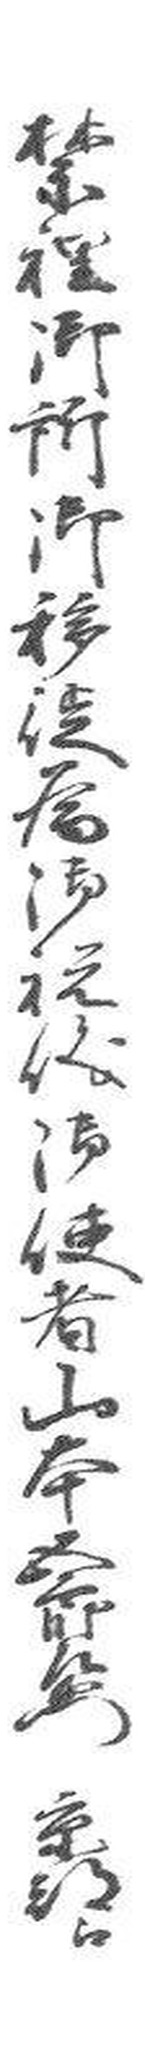禁裡御所御移徙為御祝儀御使者山本五郎左衛門京都江
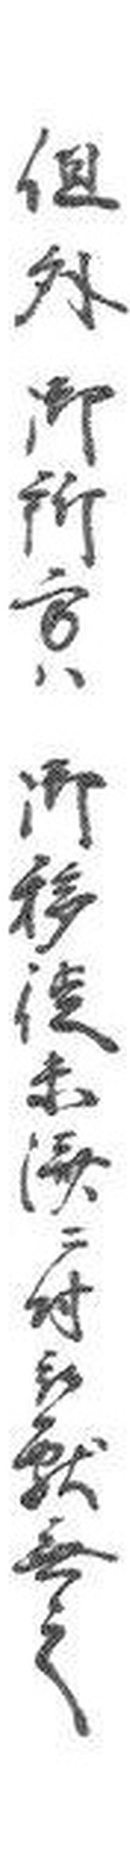但外御所方は御移徙未済ニ付献無之
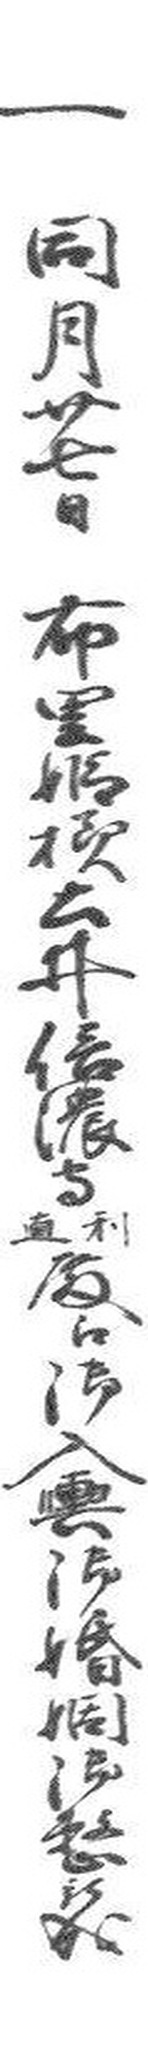一同月廿七日布里姫様土井信濃守利直殿江御入輿御婚姻御整被成
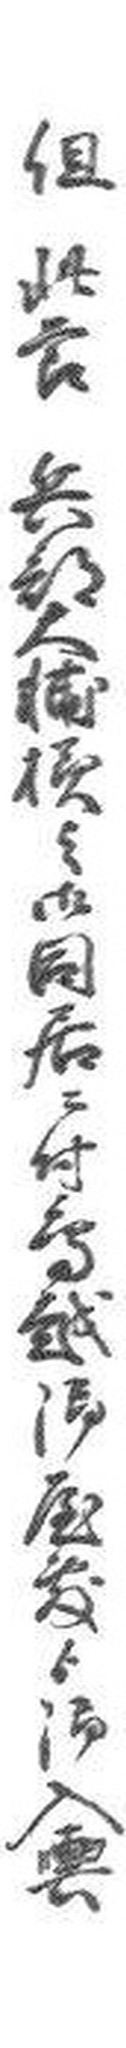但此節兵部大輔様与御同居ニ付鳥越御屋敷ゟ御入輿
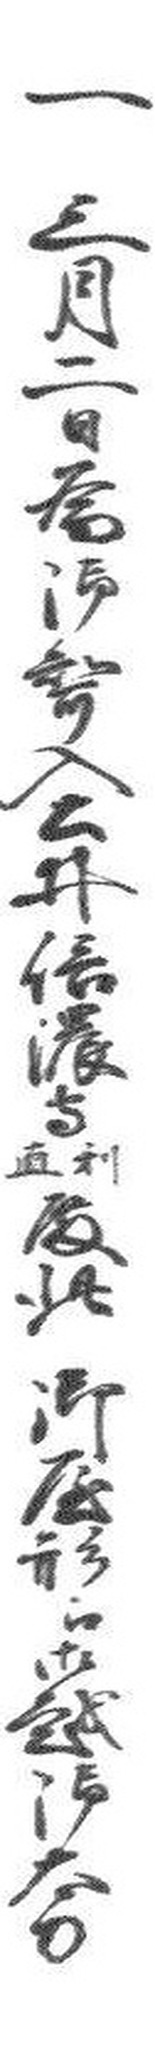一三月二日為御聟入土井信濃守利直殿此御屋形江御越御太刀
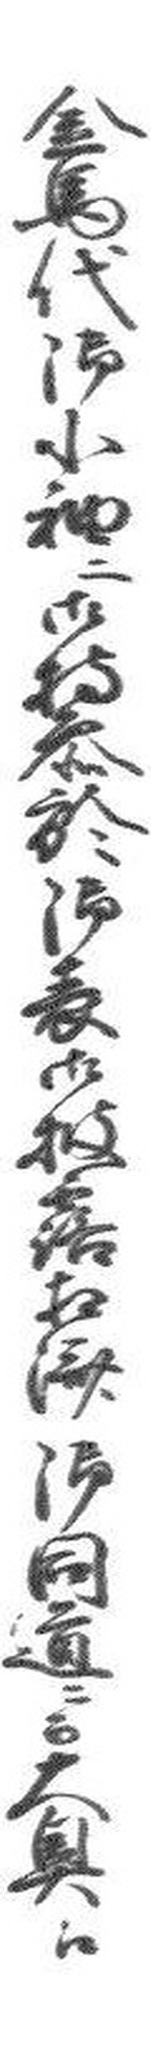金馬代御小袖二御持参於御表御披露相済御同道ニ而大奥江
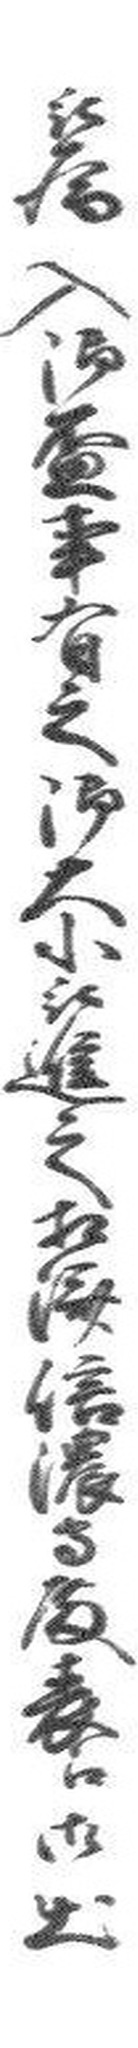被為入御盃事有之御大小被進之相済信濃守殿表江御出
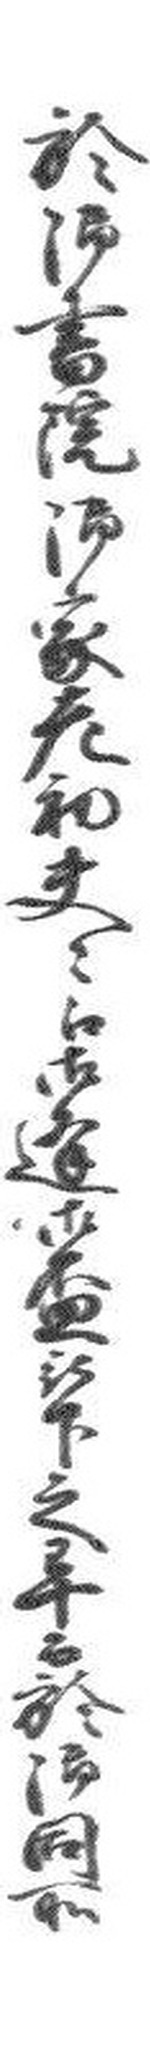於御書院御家老初夫々御逢御盃被下之畢而於御同所
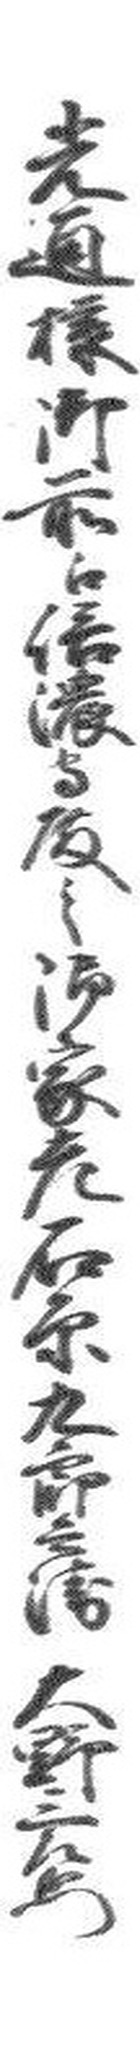光通様御前江信濃守殿之御家老石原九郎兵衛大野三左衛門
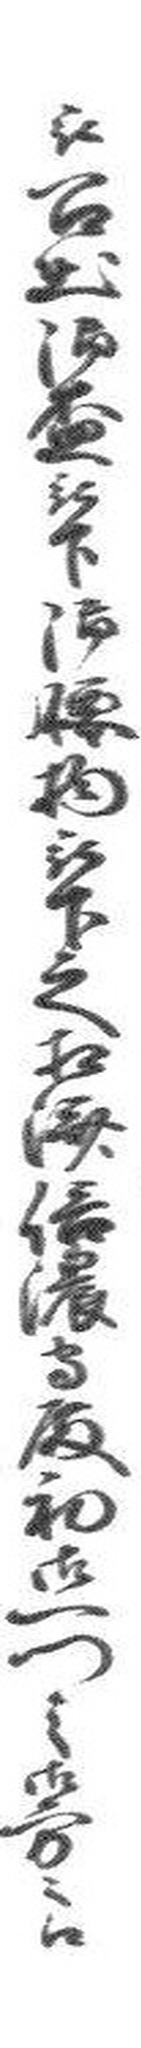被召出御盃被下御腰物被下之相済信濃守殿初御一門之御方々江
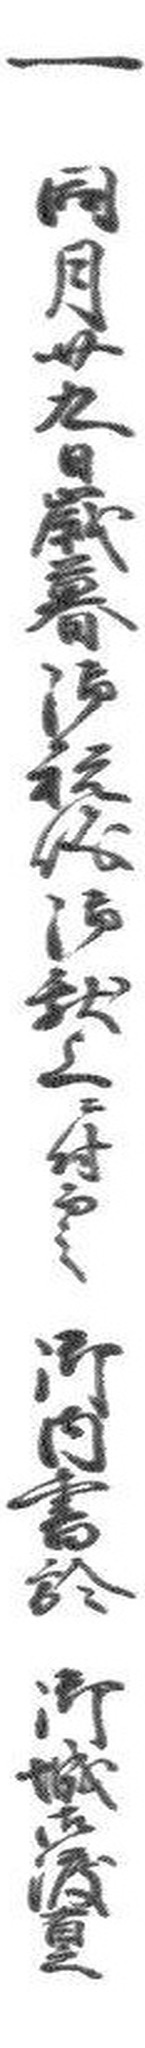一同月廿九日歳暮御祝儀御献上ニ付而之御内書於御城御渡有之

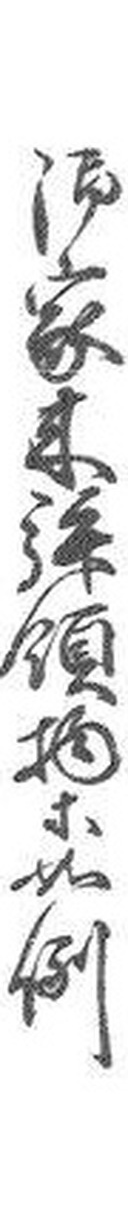御家来拝領物等如例
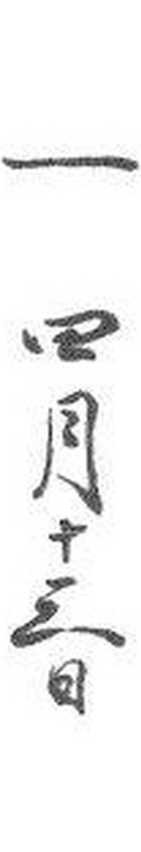一四月十三日
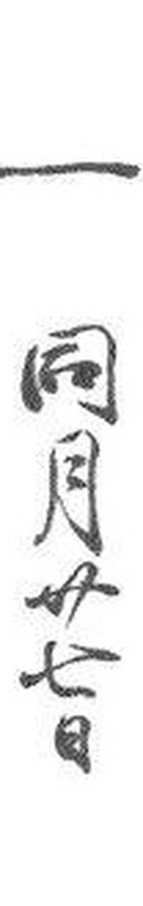一同月廿七日
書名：家譜 六 光通公 従万治三年到寛文三年
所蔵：福井県文書館 Fukui Prefectural Archives
